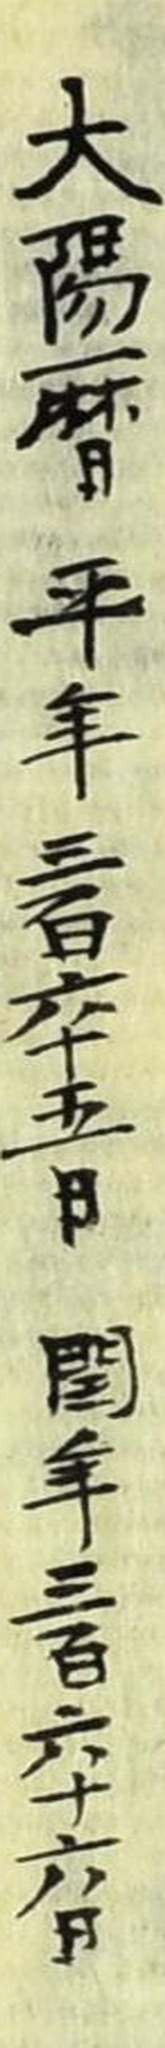太陽暦平年三百六十五日閏年三百六十六日
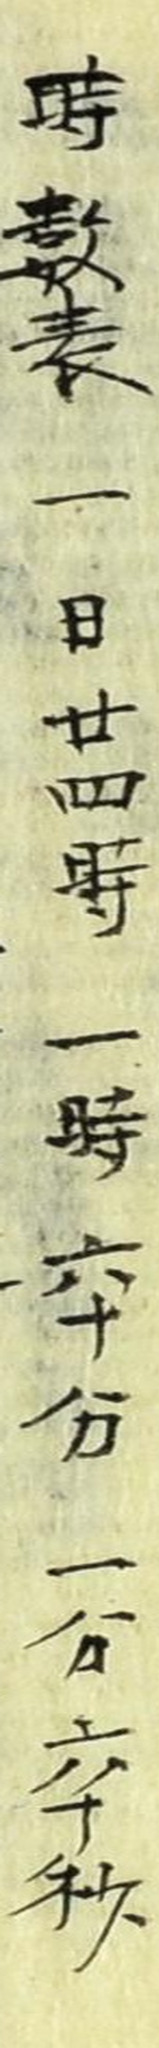時数表一日廿四時一時六十分一分六十秒
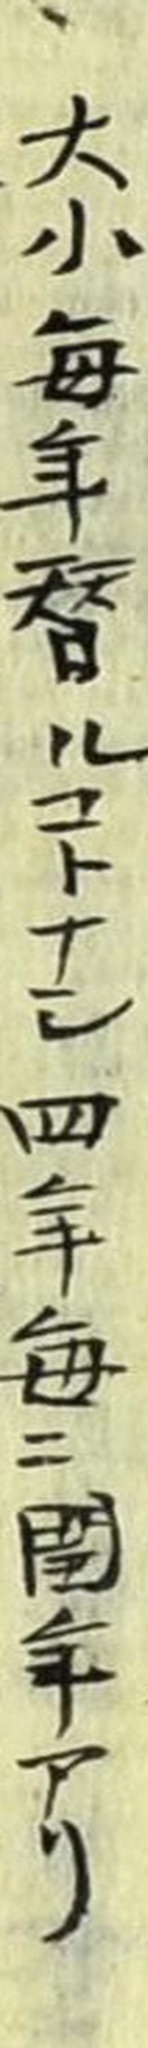時刻表大小毎年替ルコトナシ四年毎ニ閏年アリ
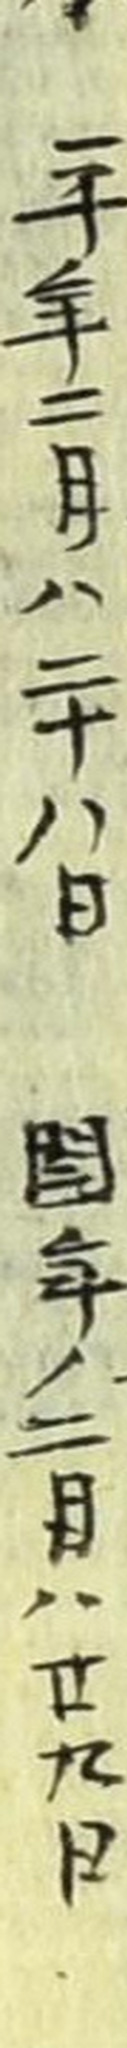平年二月ハ二十八日閏年ノ二月ハ廿九日
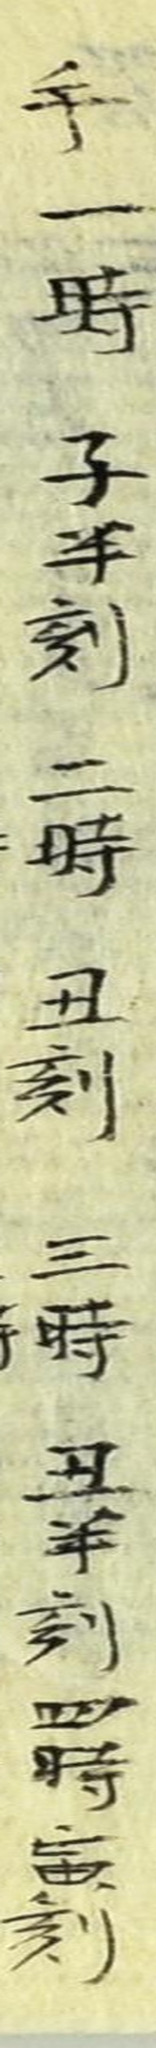午一時子半刻二時丑刻三時丑半刻四時寅刻
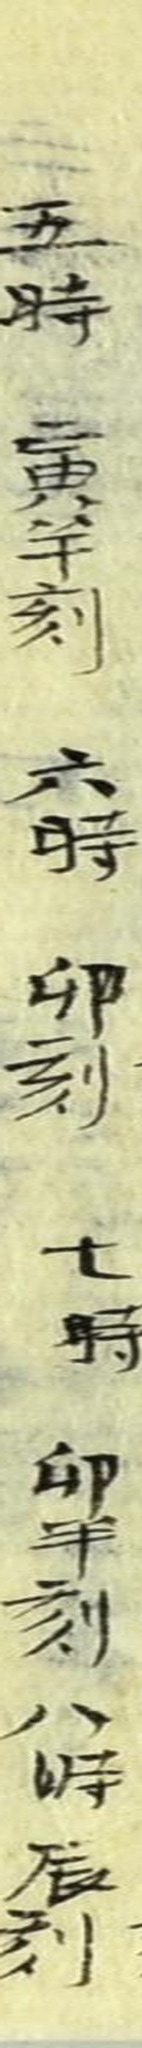五時寅半刻六時卯刻七時卯半刻八時辰刻
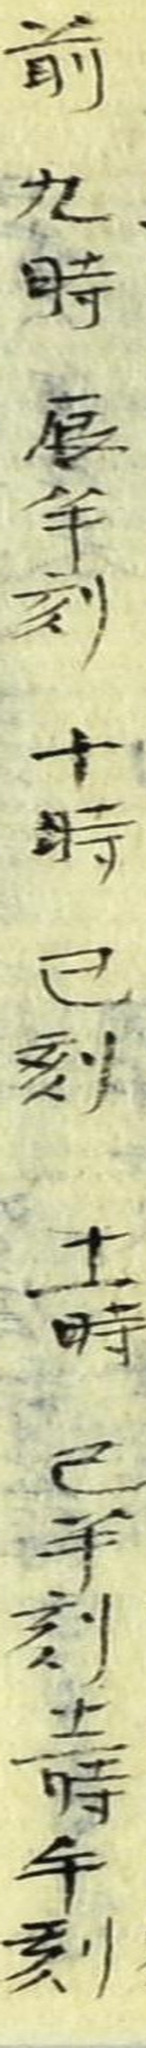前九時辰半刻十時巳刻十一時巳半刻十二時午刻
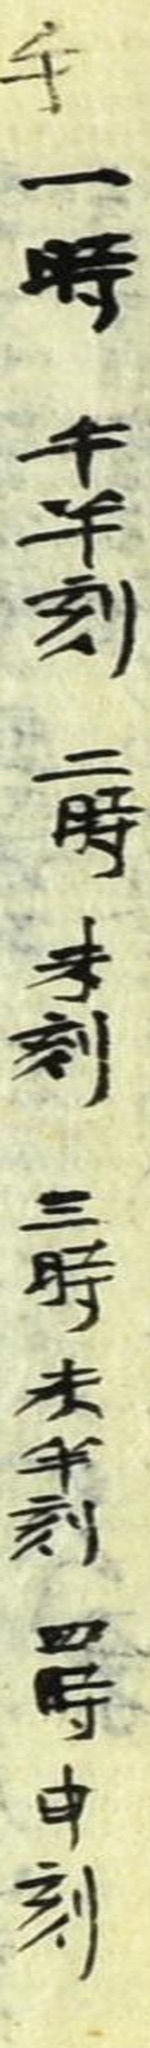午一時午半刻二時未刻三時未半刻四時申刻
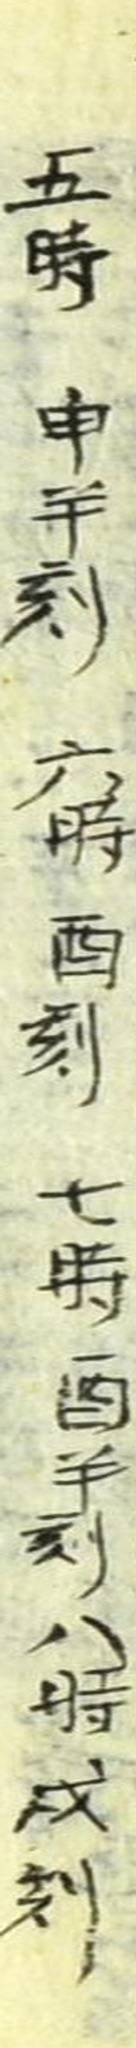五時申半刻六時酉刻七時酉半刻八時戌刻
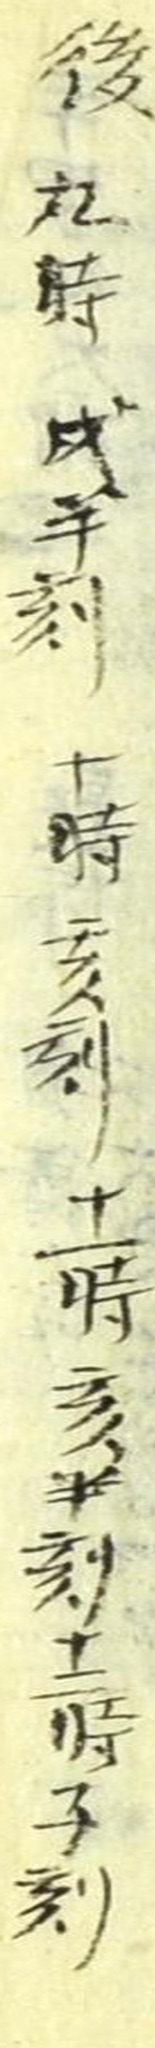後九時戌半刻十時亥刻十一時亥半刻十二時子刻

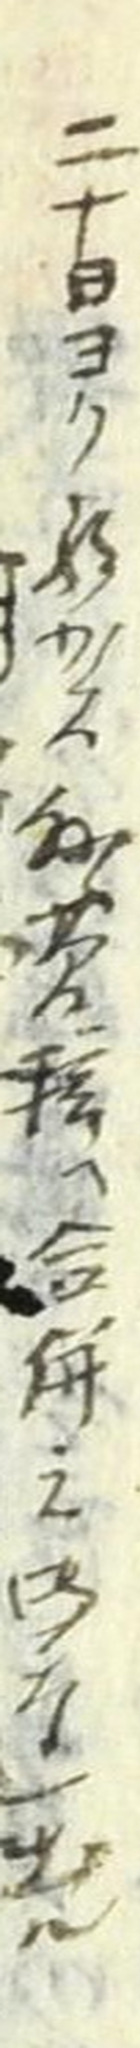二十日ヨリ敦賀県管轄へ合併之御達出ル
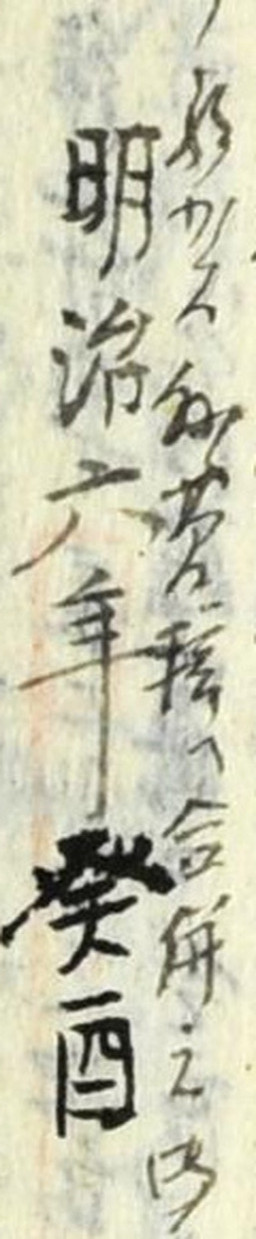明治六年癸酉
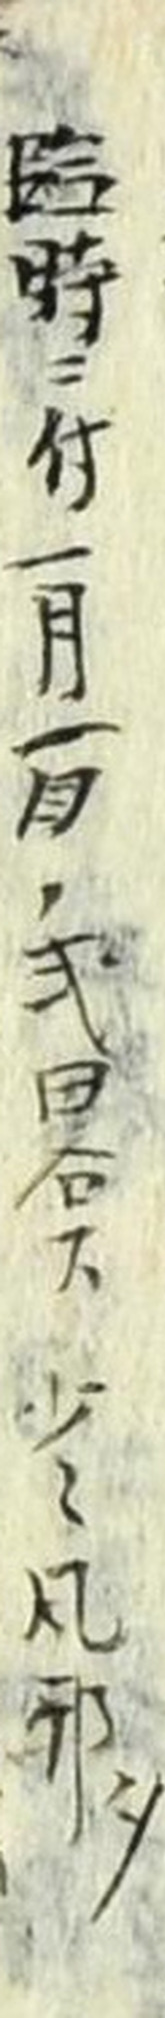臨時ニ付一月一日ノ式略ス少々風邪
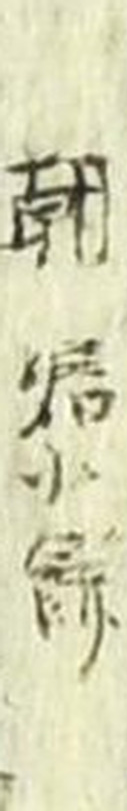朝焙小餅
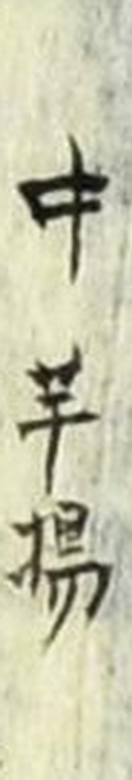中芋揚
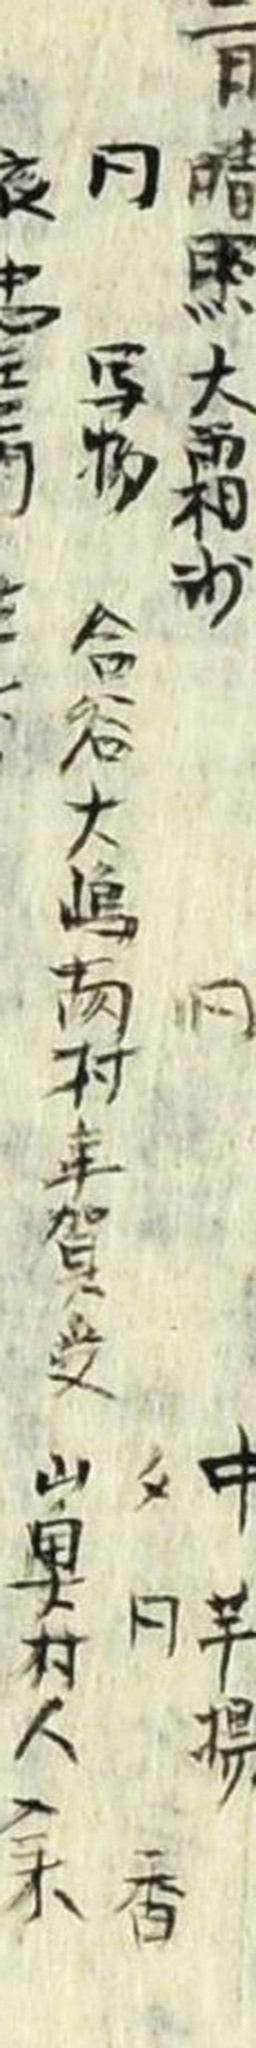同写物合谷大島両村年賀受山奥村人入来
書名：（日記）
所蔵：福井県文書館 Fukui Prefectural Archives
